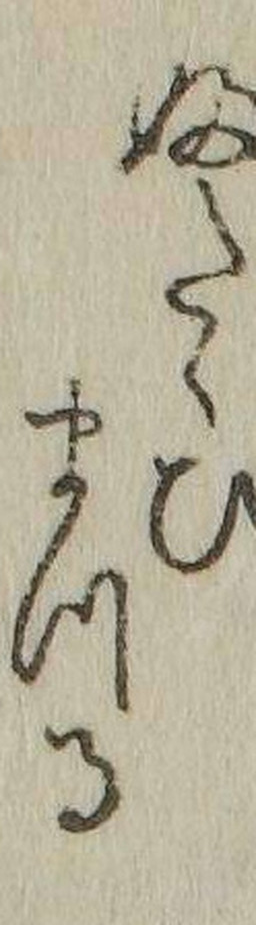まつる
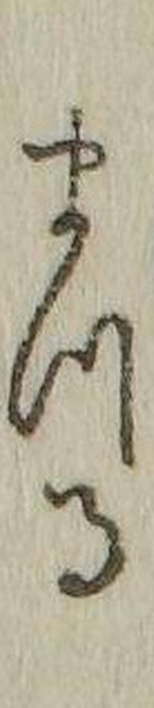まつる
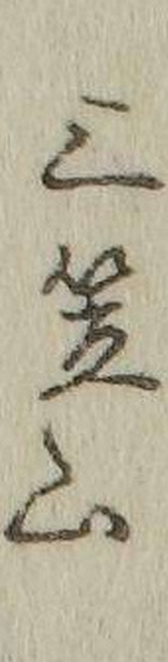三笠山
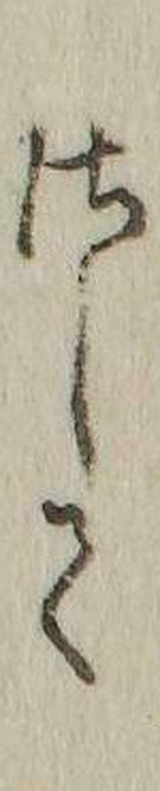さして
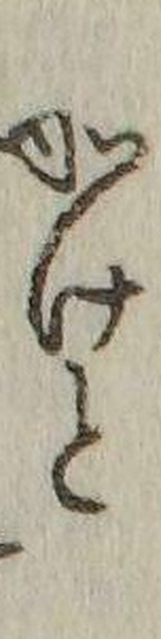かけと
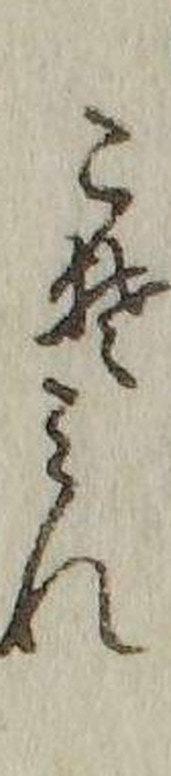こそみれ

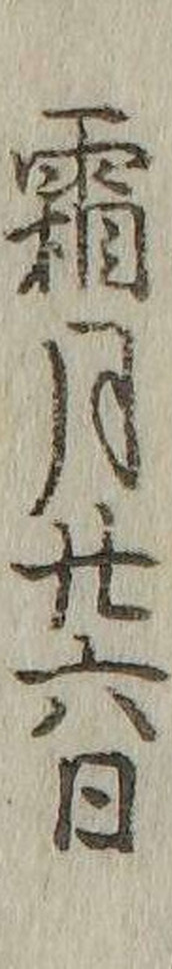霜月廿六日

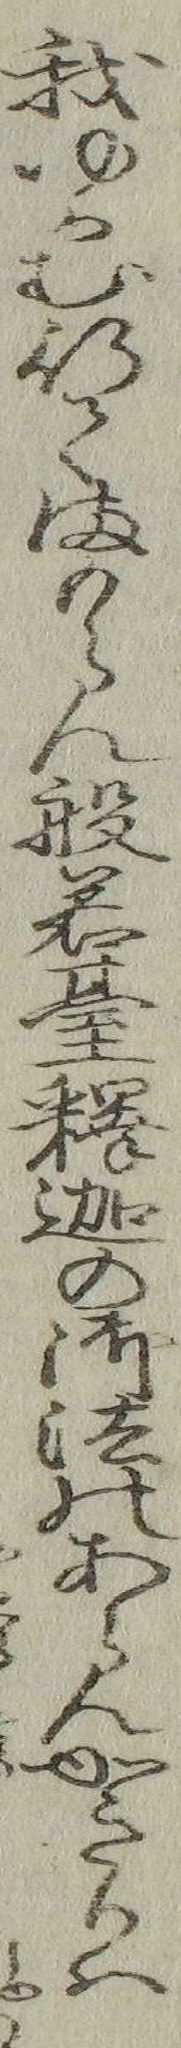我ゆかむ行てまもらん般若䑓釋迦の御法のあらんかきりは
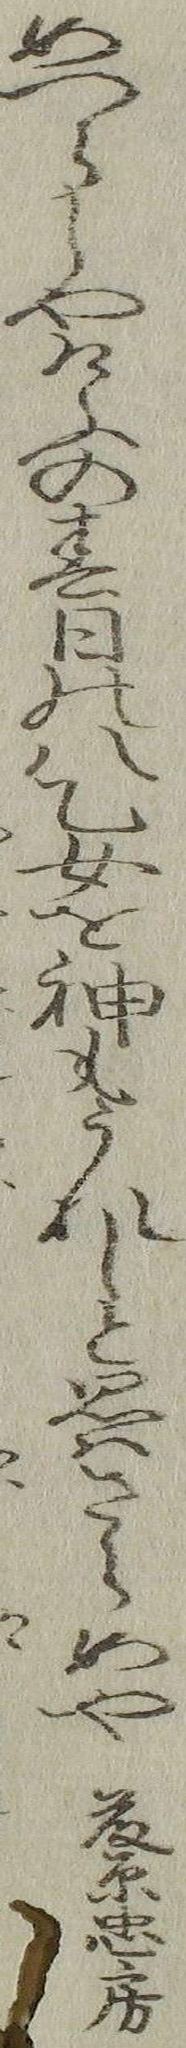めつらしやけふの春日の八乙女を神もうれしと思はさらめや藤原忠房
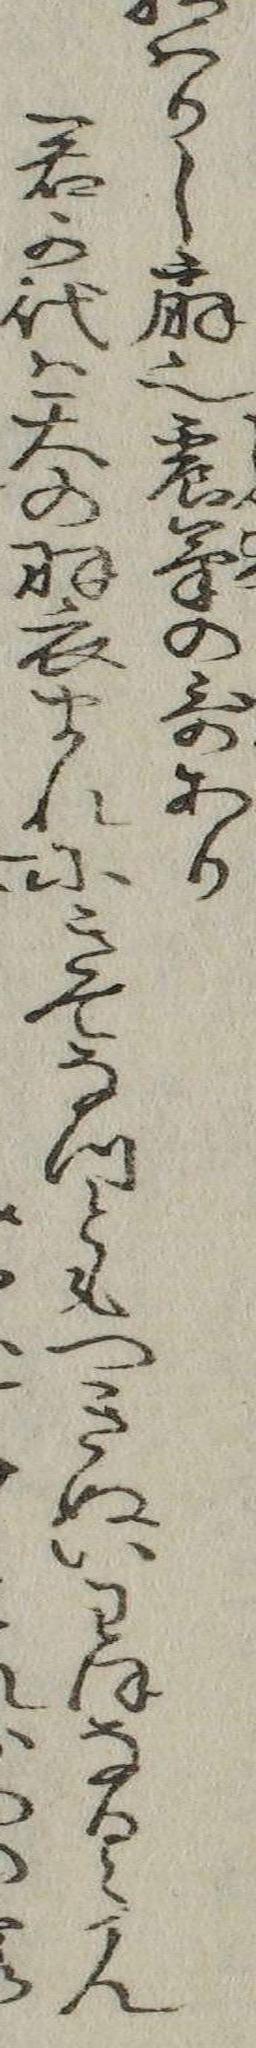君か代は天の羽衣まれにきてなつともつきぬいわほなるらん
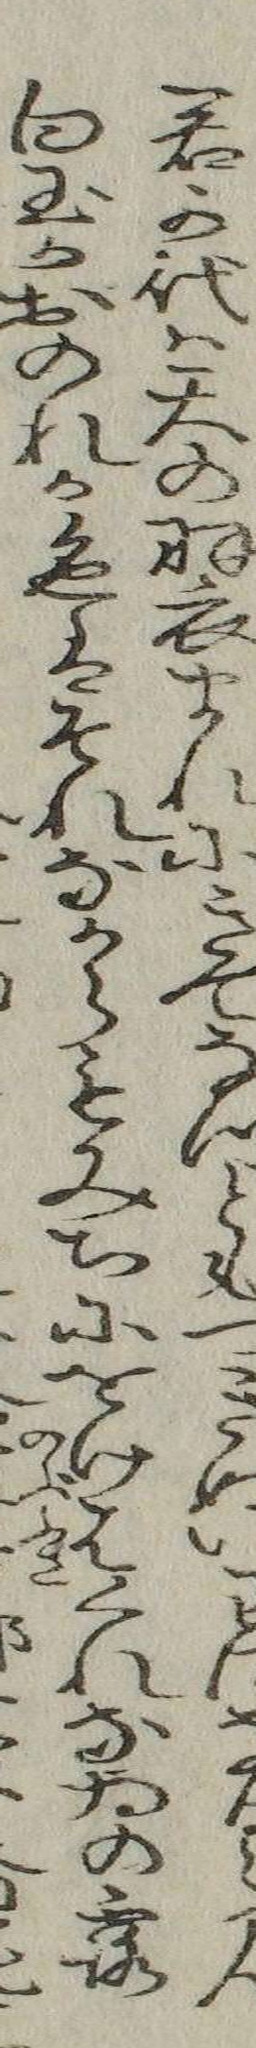白玉かおのれか色はそれなからもみちにをけはくれなゐの露

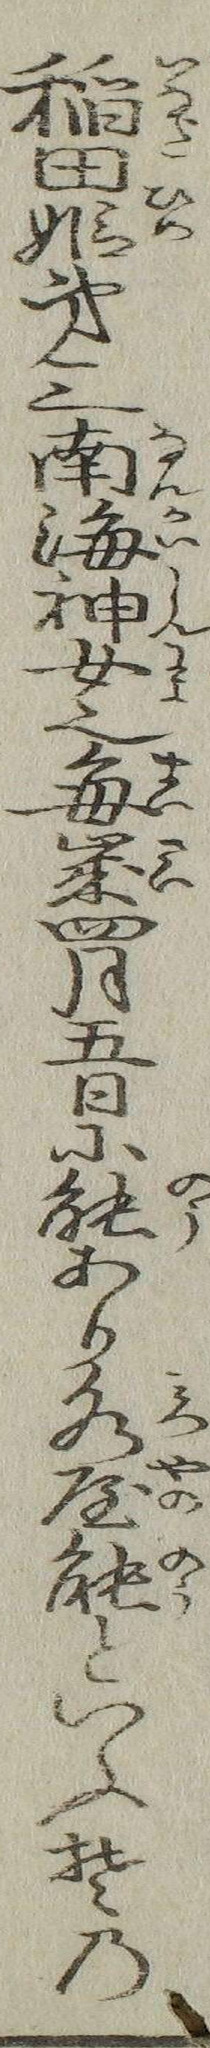稲田姫㐧三南海神女也毎歲四月五日に能あり水屋能といふその
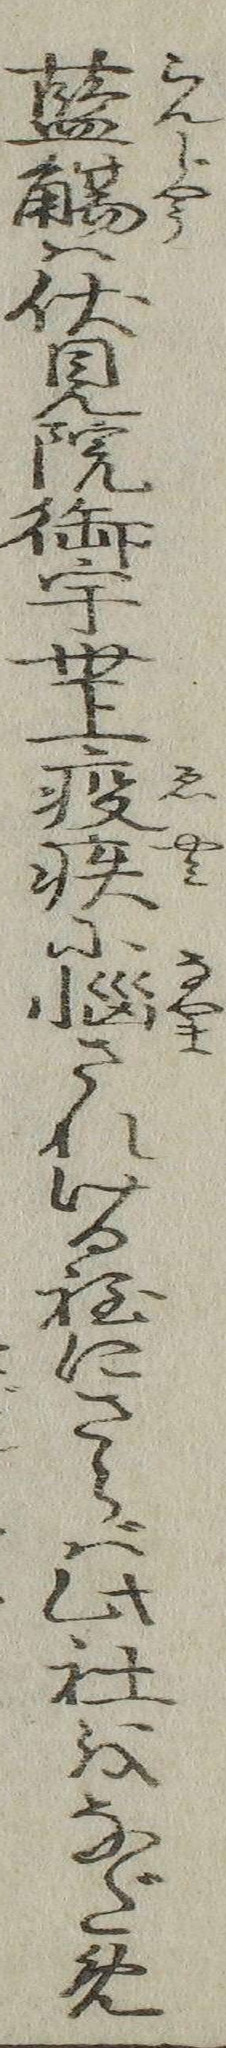藍觴は伏見院御宇世上疫疾に惱されける程にさらば此社をなだめ
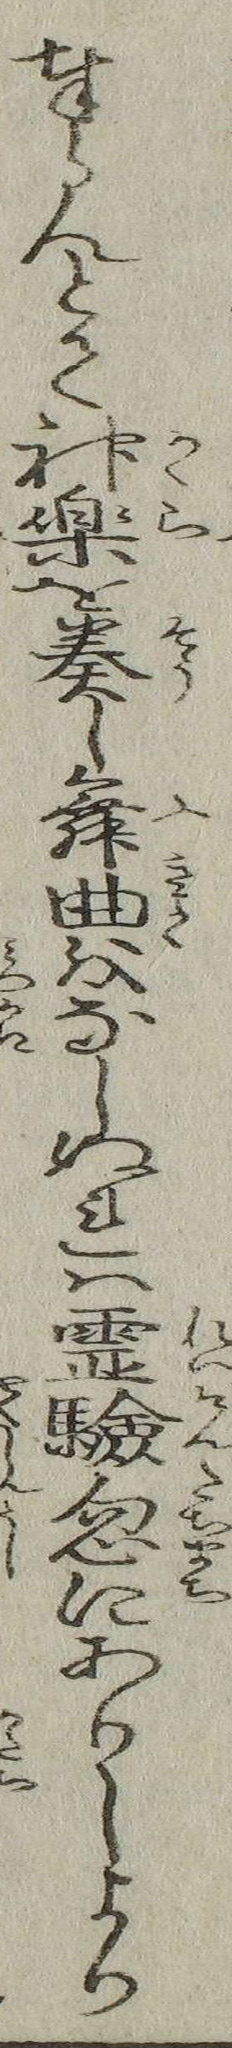奉らんとて神樂を奏し舞曲をなしぬれは霊驗忽にありしより
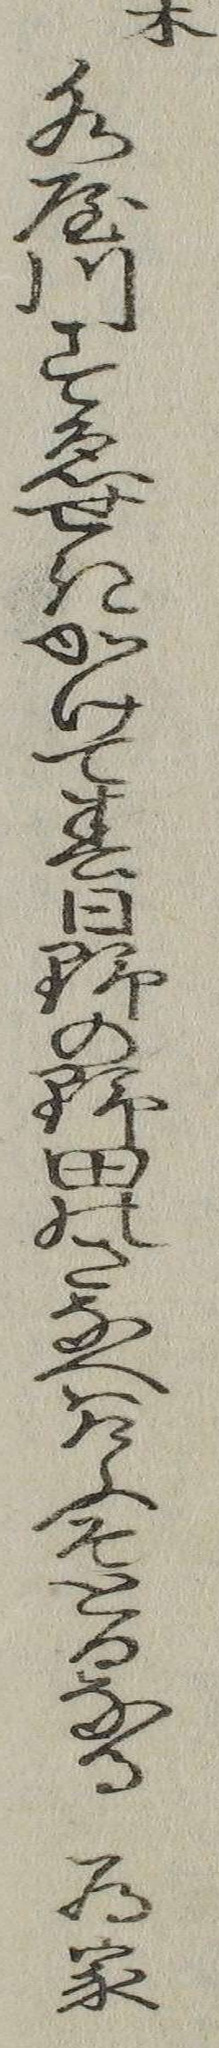夫木水屋川すゑせきかけて春日野の野田のさなへはけふそとるなる為家
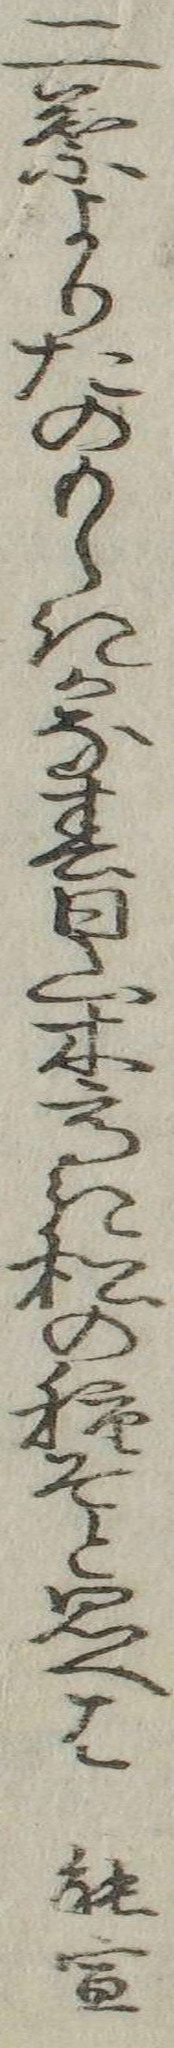拾遺二葉よりたのもしきかな春日山木高き松の種そと思へは能宣
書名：大和名所圖會
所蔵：国文学研究資料館
